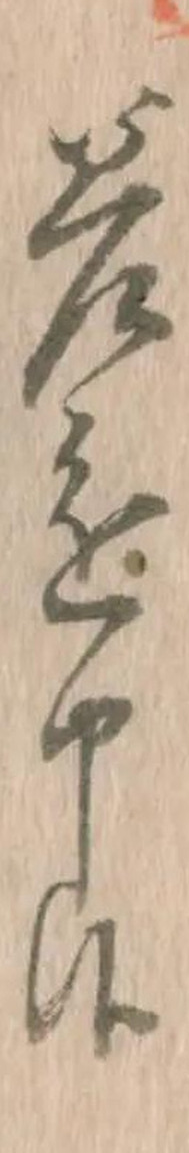差進申候
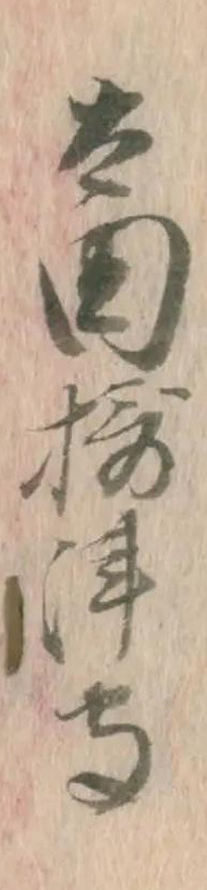太田摂津守
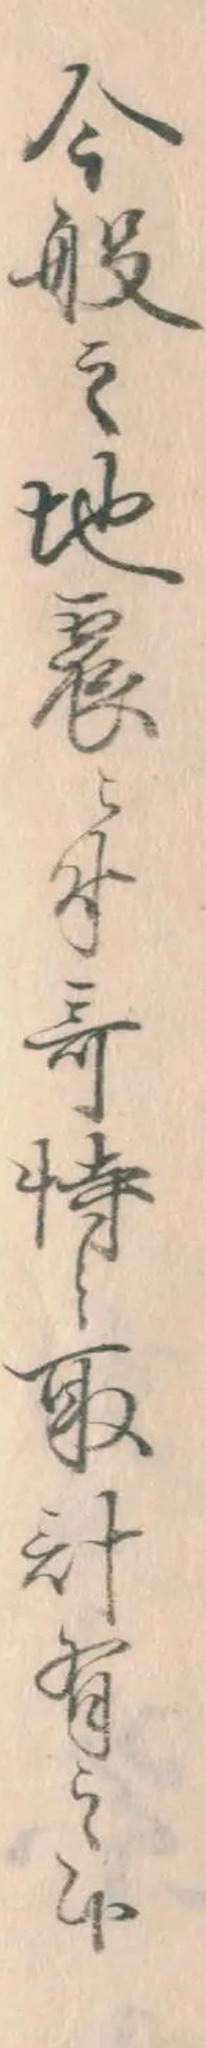今般之地震ニ付奇特之取計有之候
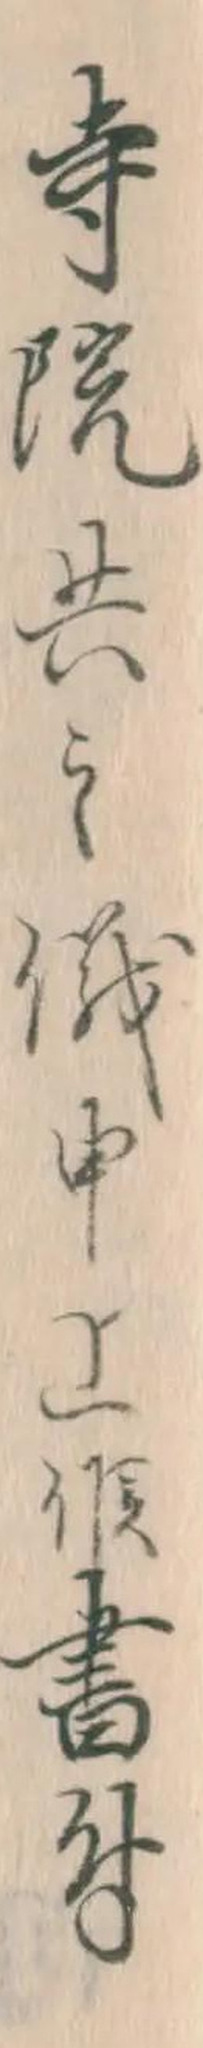寺院共之儀申上候書付
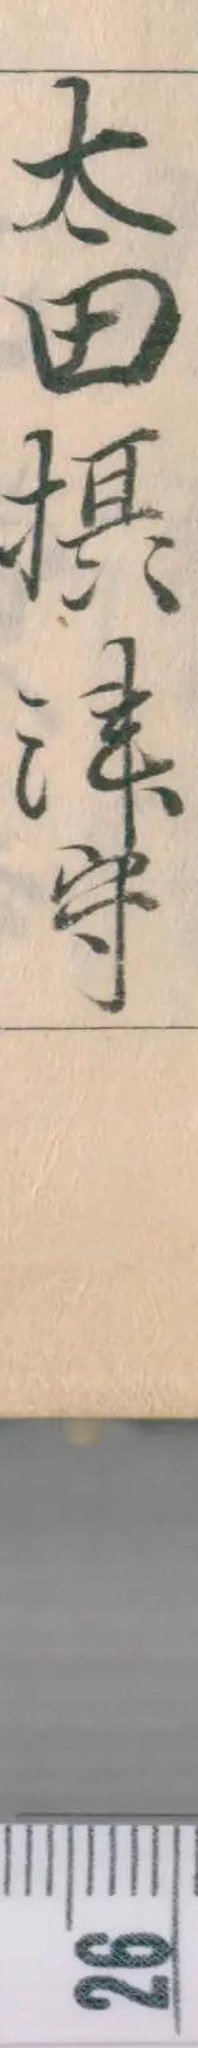太田摂津守
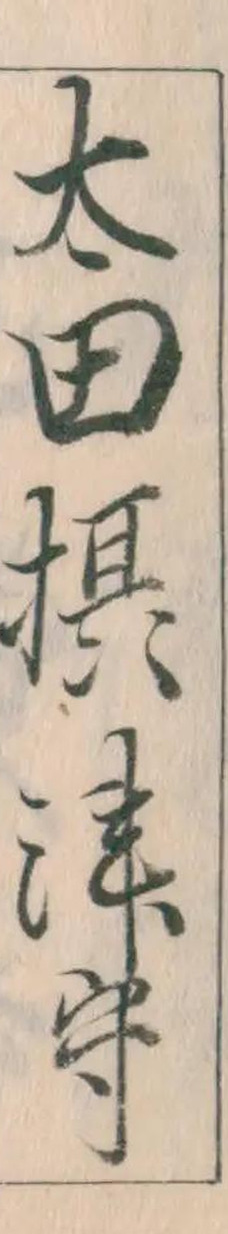太田摂津守
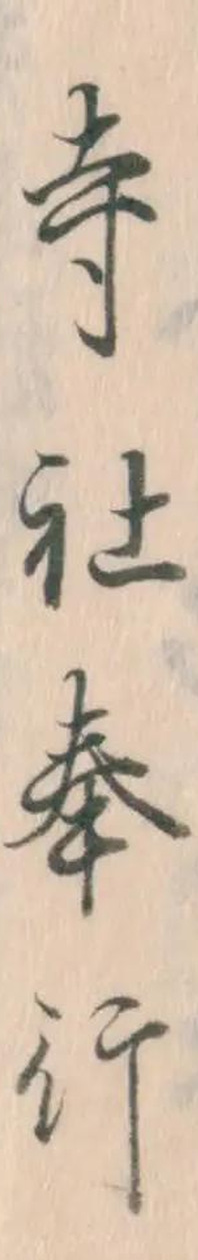寺社奉行
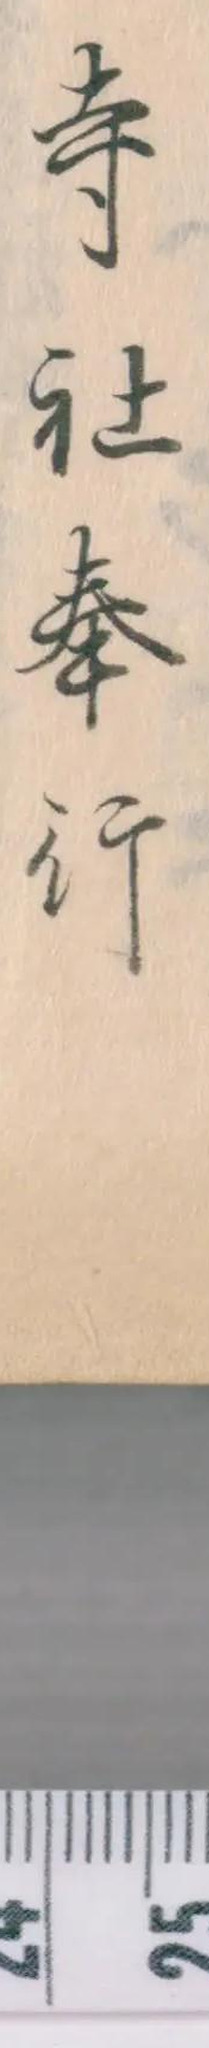寺社奉行
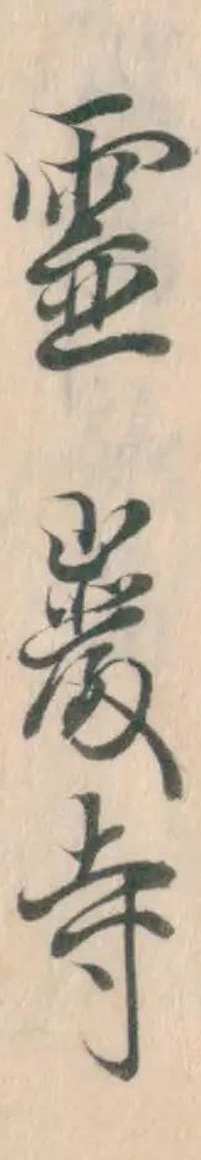霊巌寺

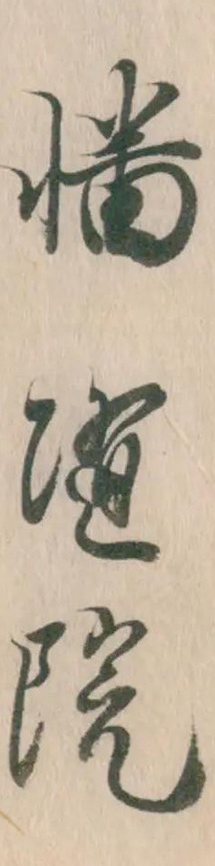幡随院
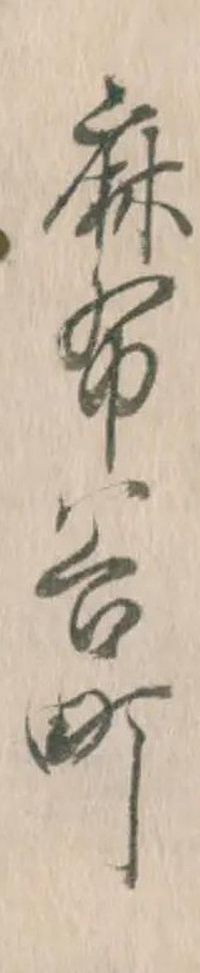麻布谷町
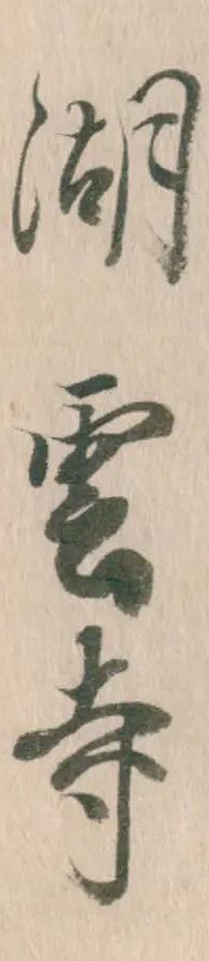湖雲寺
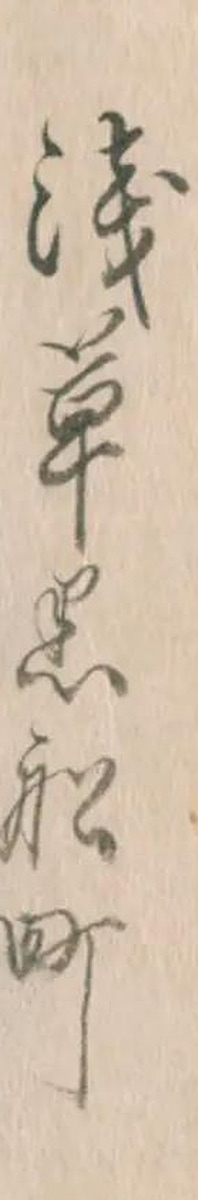浅草黒船町
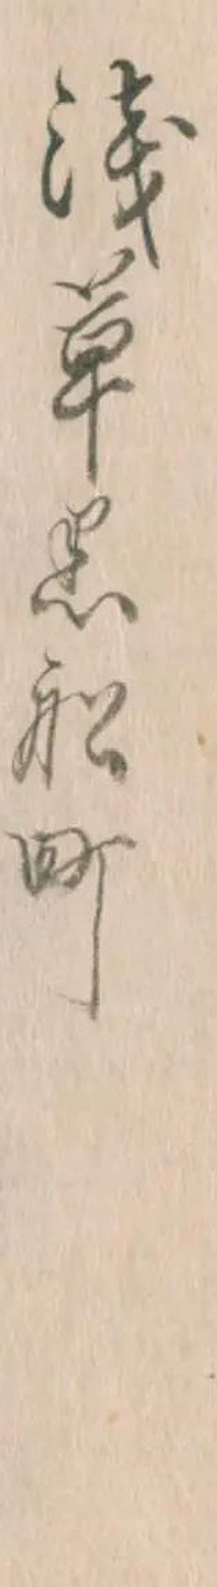浅草黒船町
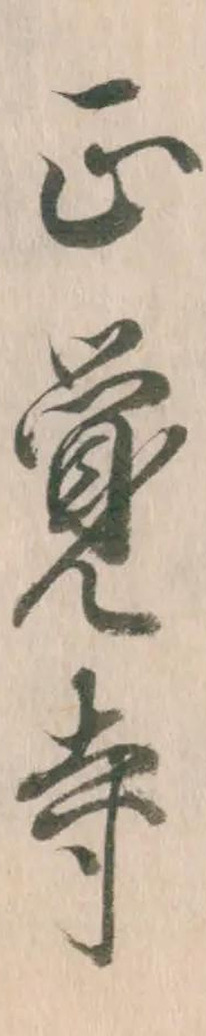正覚寺
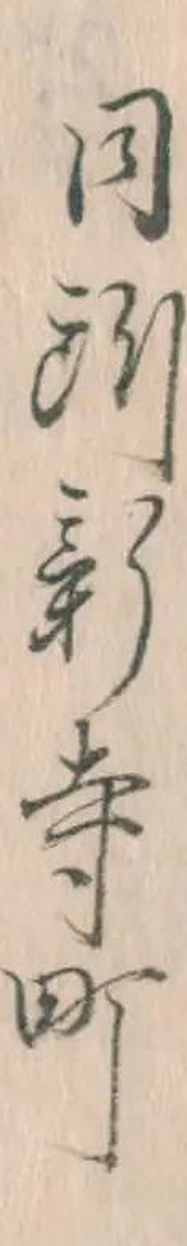同所新寺町
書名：武家方并寺院等ニテ施差出候一件
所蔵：国立国会図書館 National Diet Library, JAPAN
